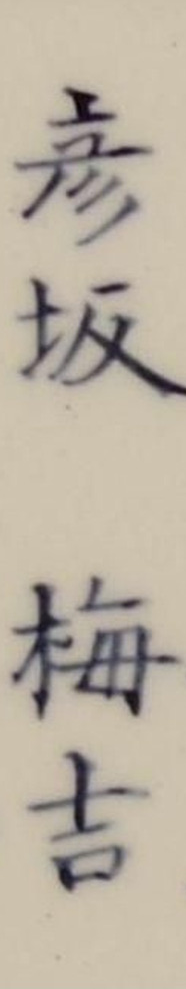彦坂梅吉
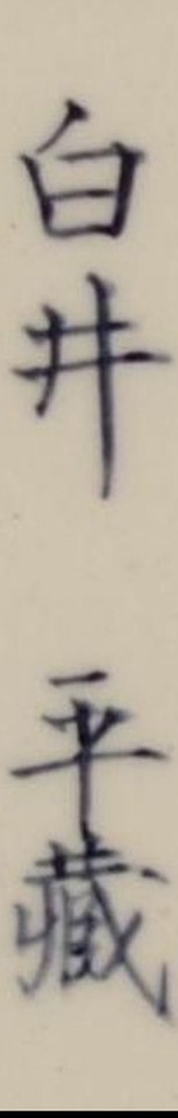白井平蔵
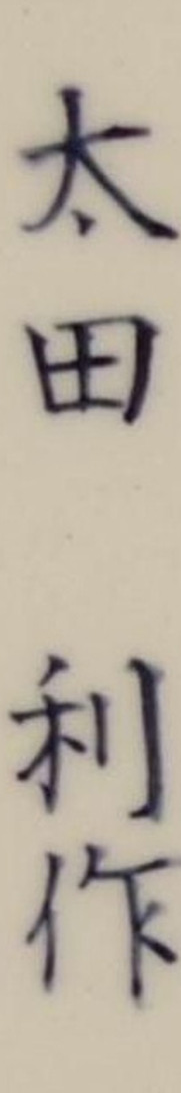太田利作

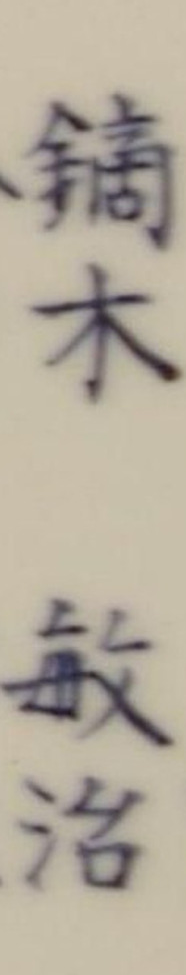鏑木敏治
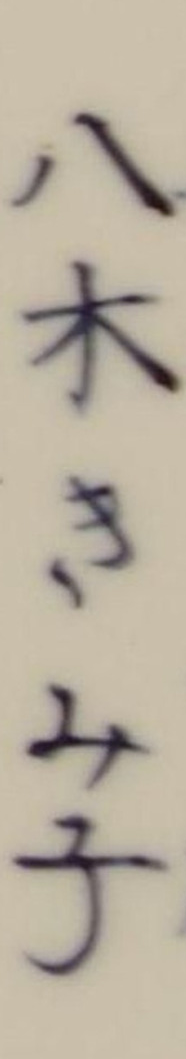八木きみ子
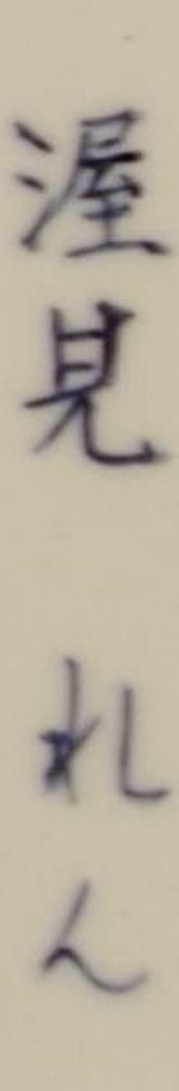渥美れん
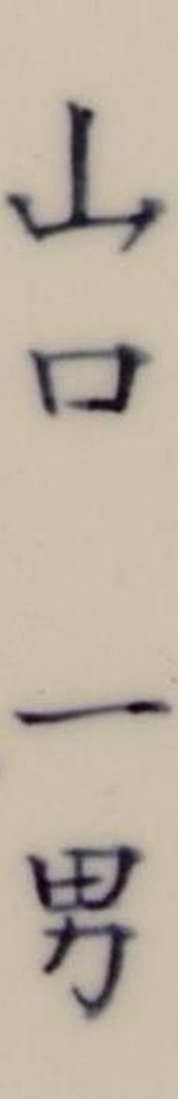山口一男
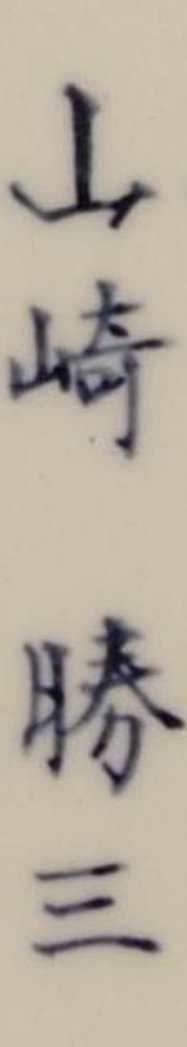山崎勝三
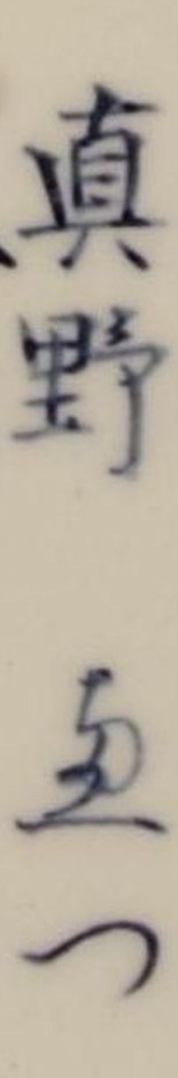真野えつ
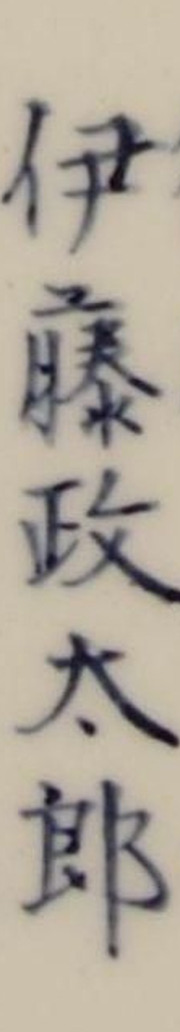伊藤政太郎
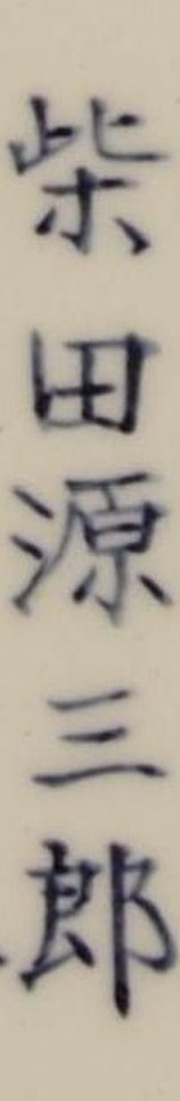柴田源三郎
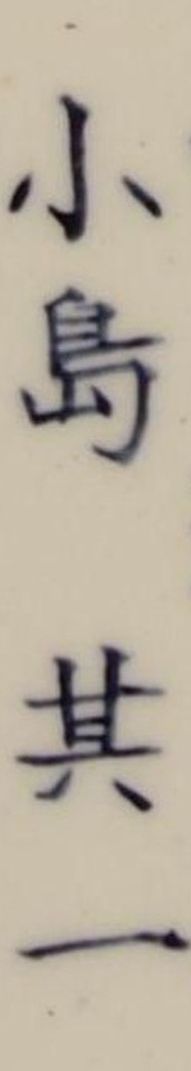小島其一
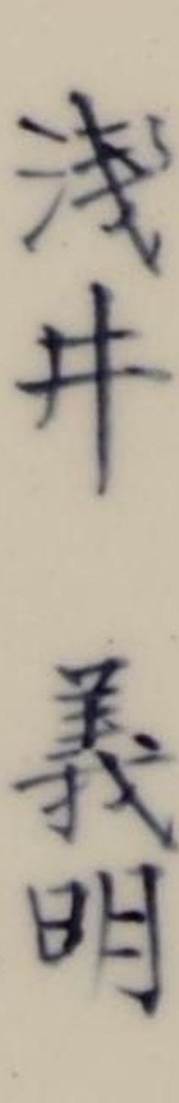浅井義明
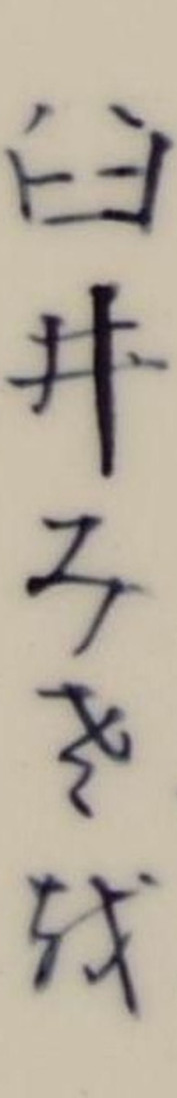臼井みさを
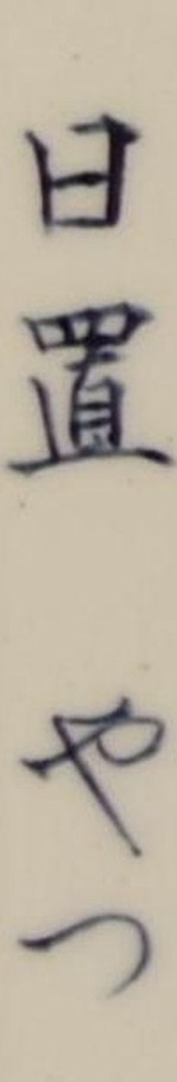日置やつ

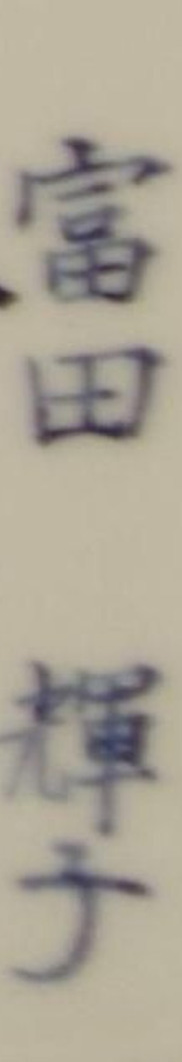富田輝子
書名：E~L
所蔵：高野山金剛峯寺
